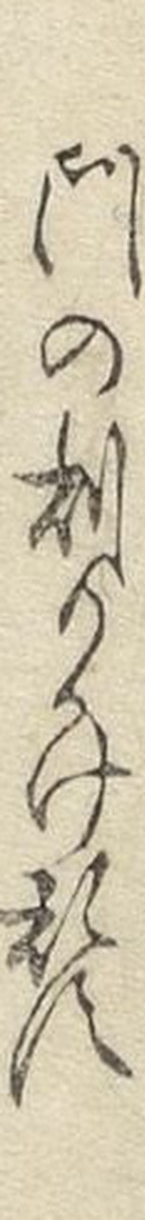門の削りかけ乱す
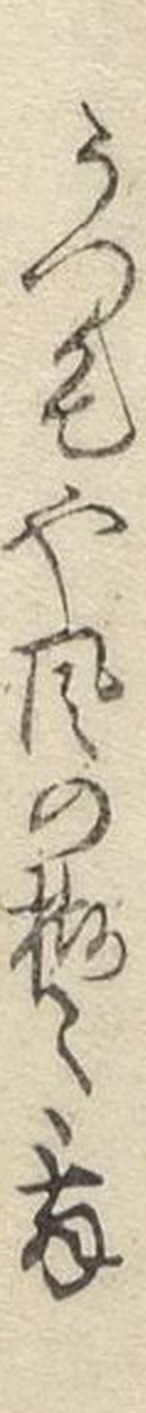うつもや風の獅々舞
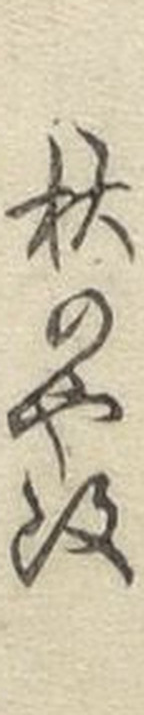秋のや改
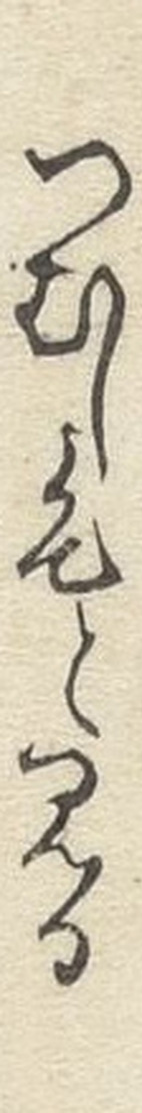つむし毛とみる
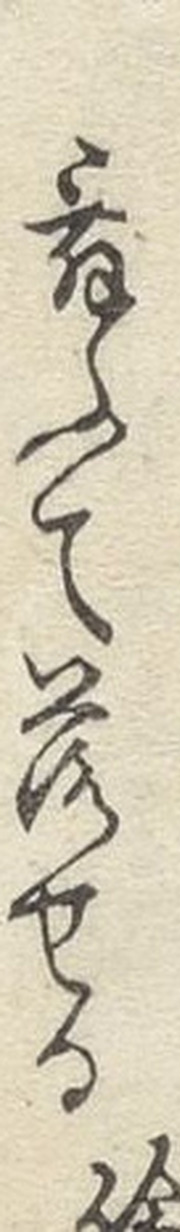舞ふて落せる
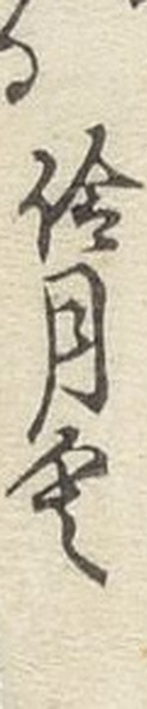伶月舎
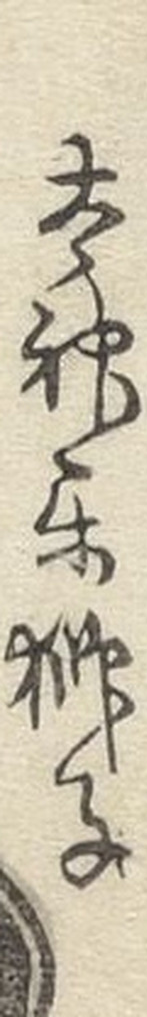太神楽獅子
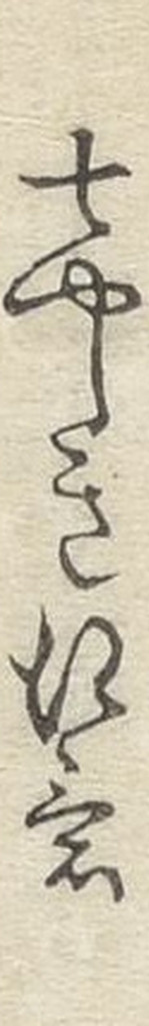七やしき行も
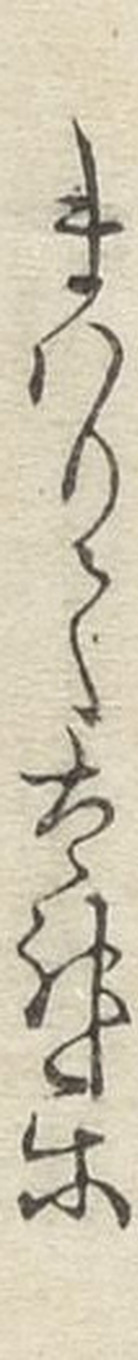まはりて太神楽
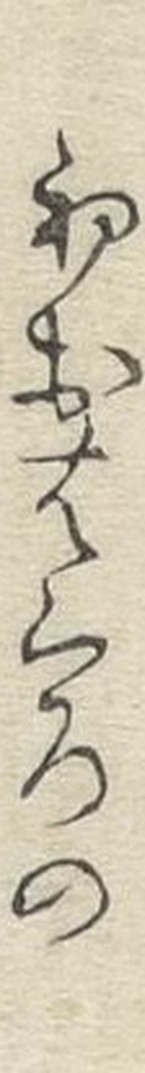初おはくろの
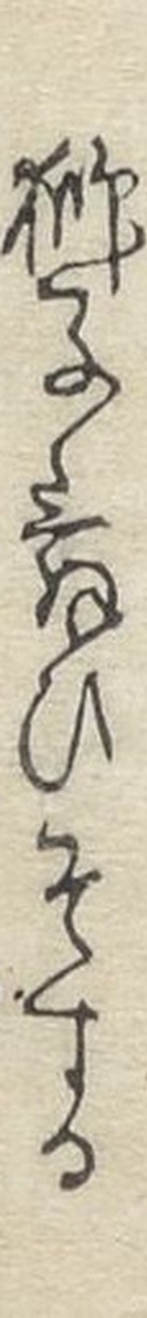獅子舞ひそする
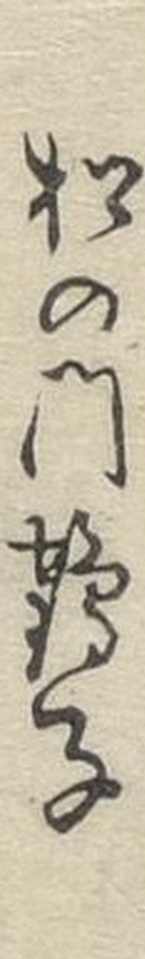松の門鶴子
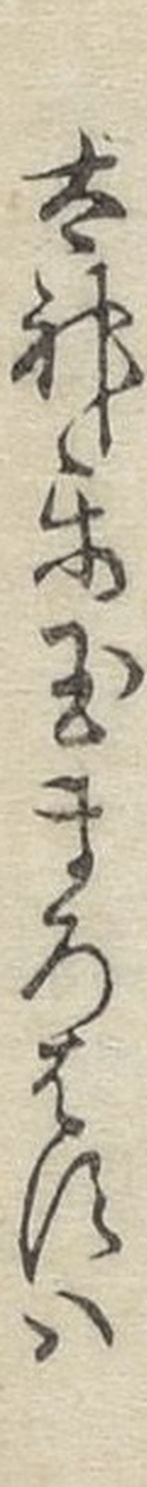太神楽玉まろはすは
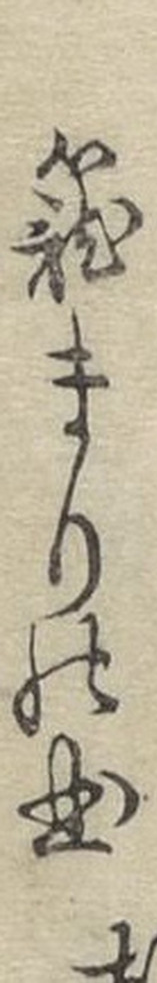籠まりの曲
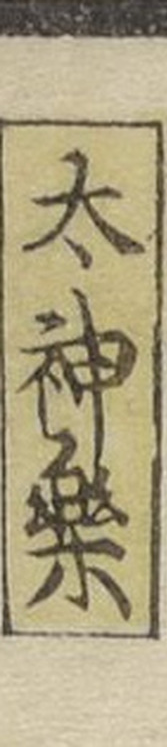太神楽

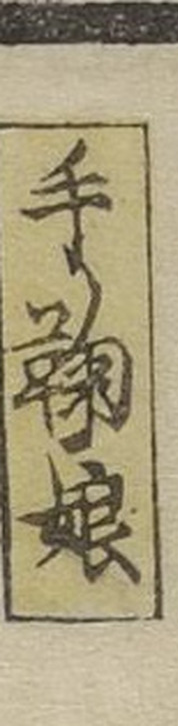手鞠娘
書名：Picture Album of People with Kyōka (Light Verse) (Kyōka shiki jinbutsu 狂歌四季人物)
